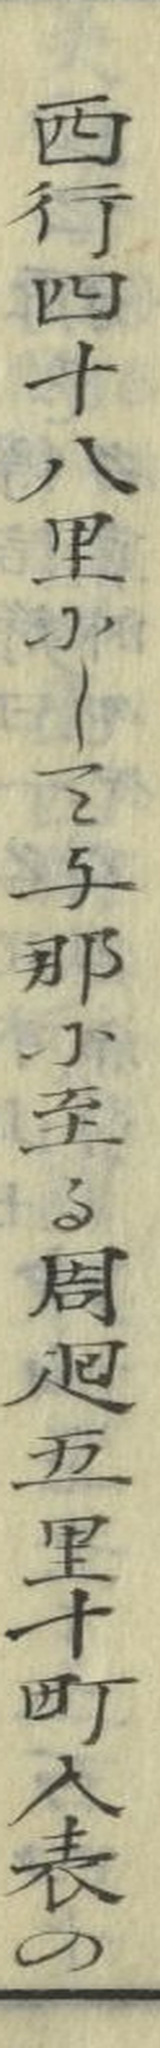西行四十八里にして与那に至る周廻五里十町入表の
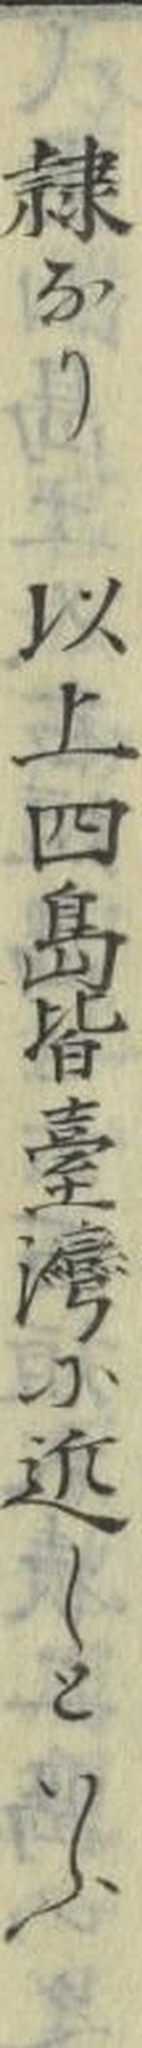隷なり以上四島皆台湾に近しといふ
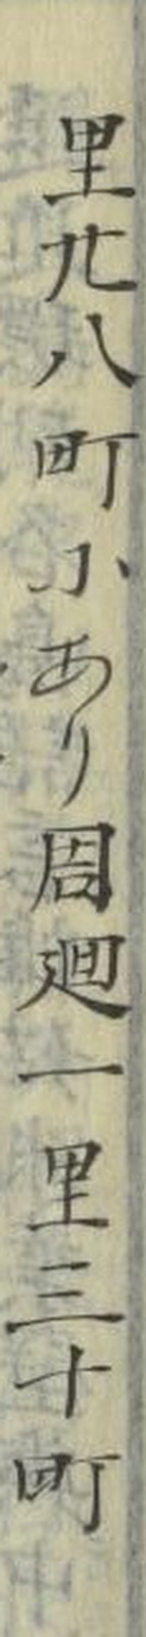里廾八町にあり周廻一里三十町
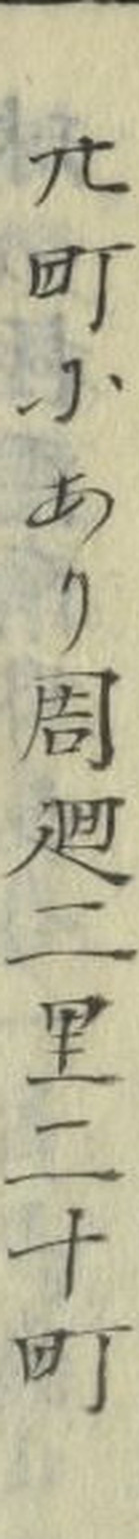廾町にあり周廻二里二十町
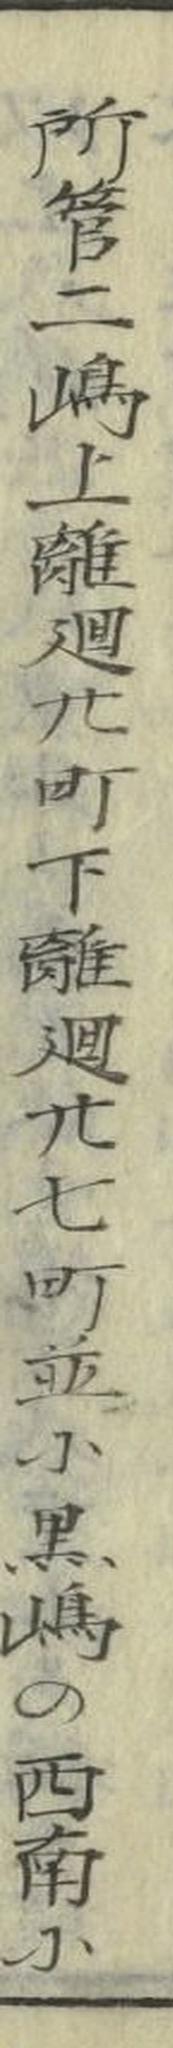所管二嶋上離廻廾町下離廻廾七町並に黒嶋の西南に
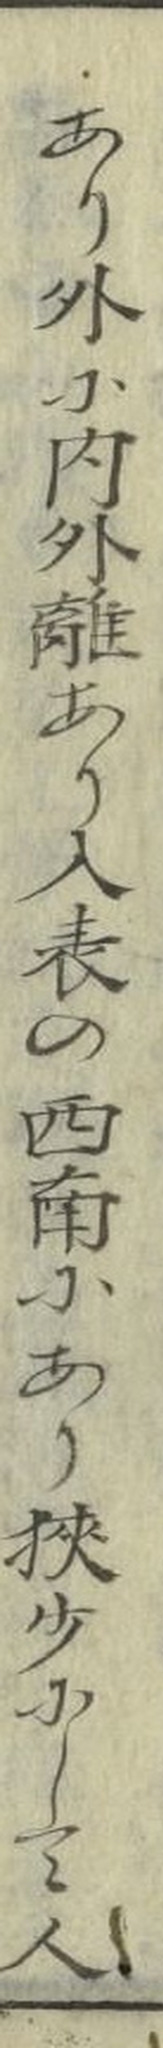あり外に内外離あり入表の西南にあり狭少にして人
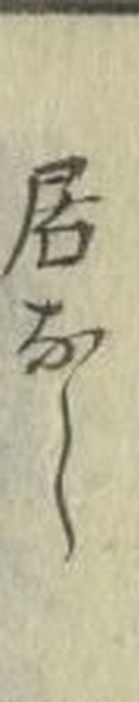居なし
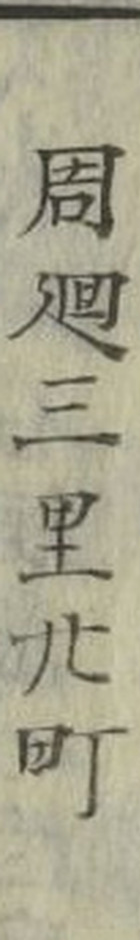周廻三里廾町

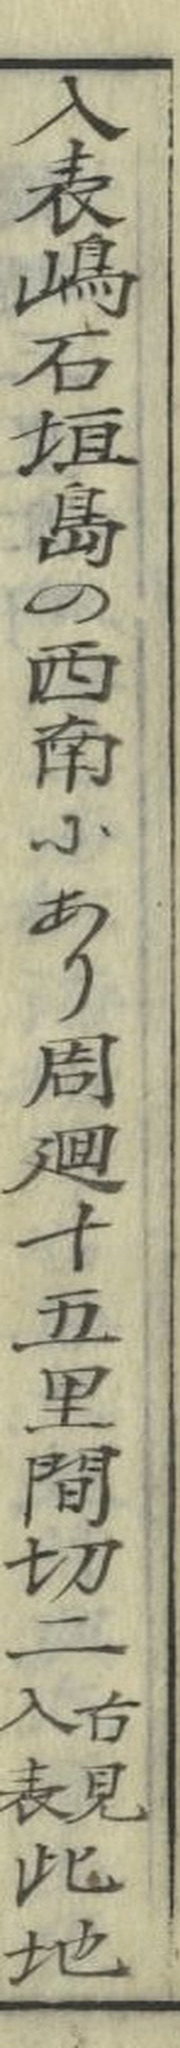入表嶋石垣島の西南にあり周廻十五里間切二古見入表此地
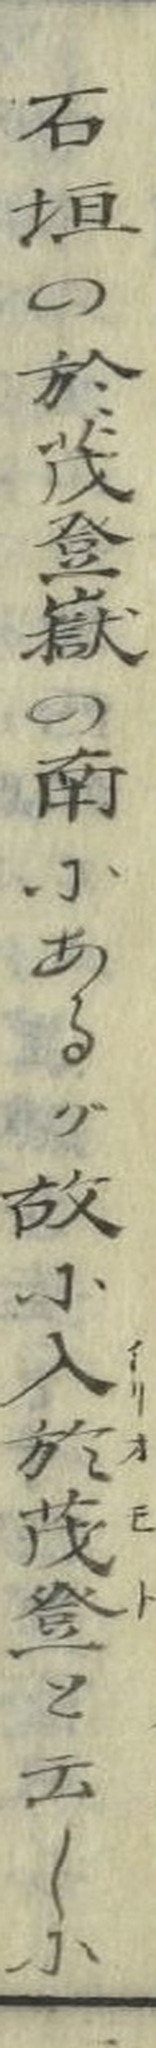石垣の於茂登嶽の南にあるが故に入於茂登と云しに
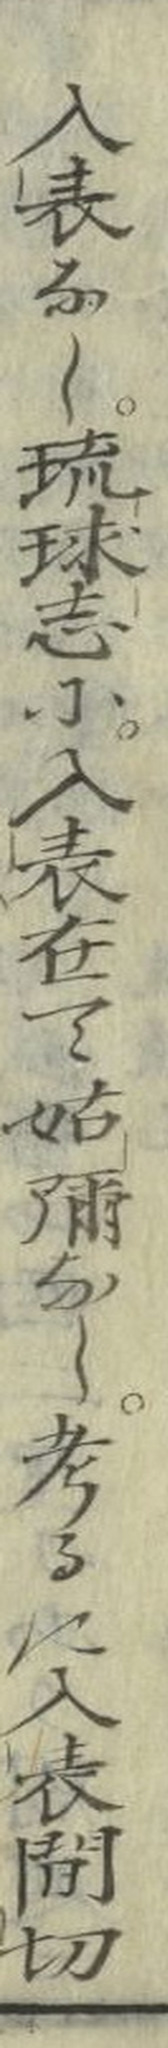入-表なし。琉-球-志に。入-表在て姑-弥なし。考るに入-表間-切
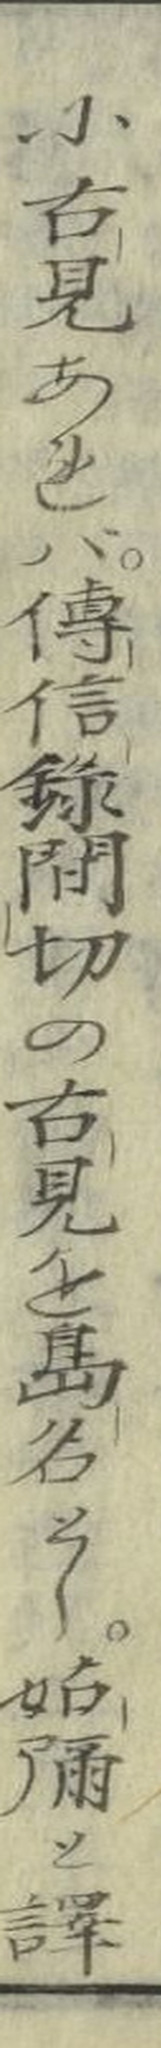に古-見あれば。伝-信-録間-切の古-見を島-名とし。姑-弥と訳
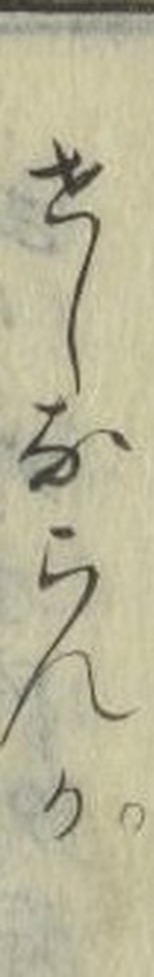せしならんか。
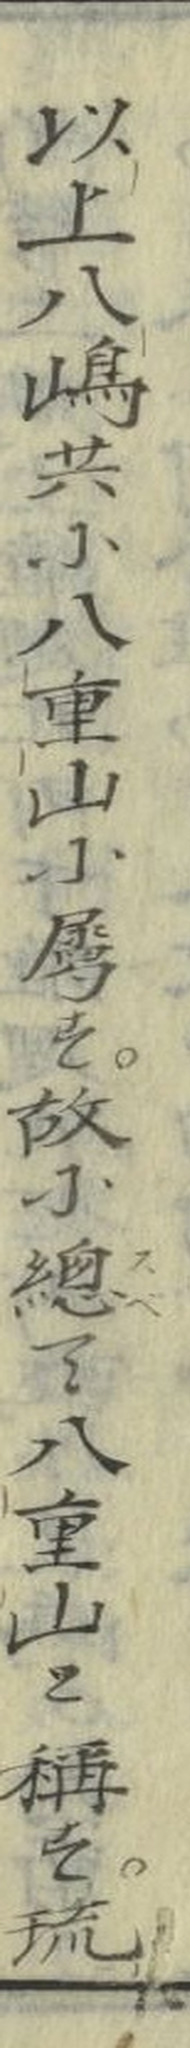以-上八-嶋共に八-重-山に属す。故に総て八-重-山と称す。琉
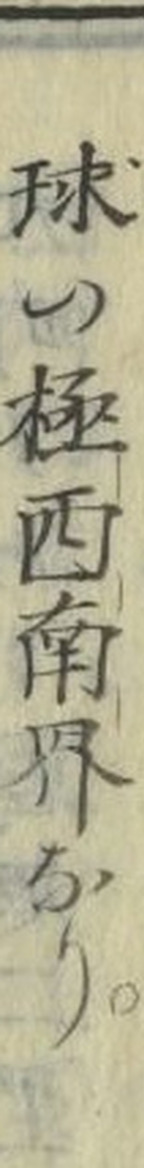球の極-西-南-界なり。
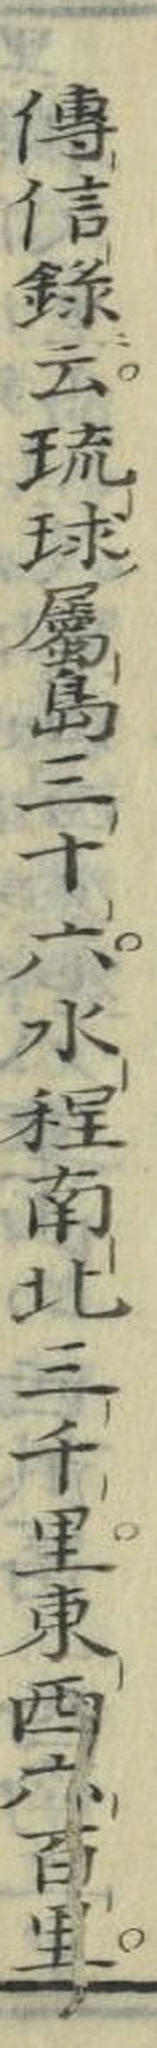伝-信-録云。琉-球属-島三-十-六。水-程南-北三-千-里。東-西六-百-里。
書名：琉球沿革志 上
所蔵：University of the Ryukyus Library
